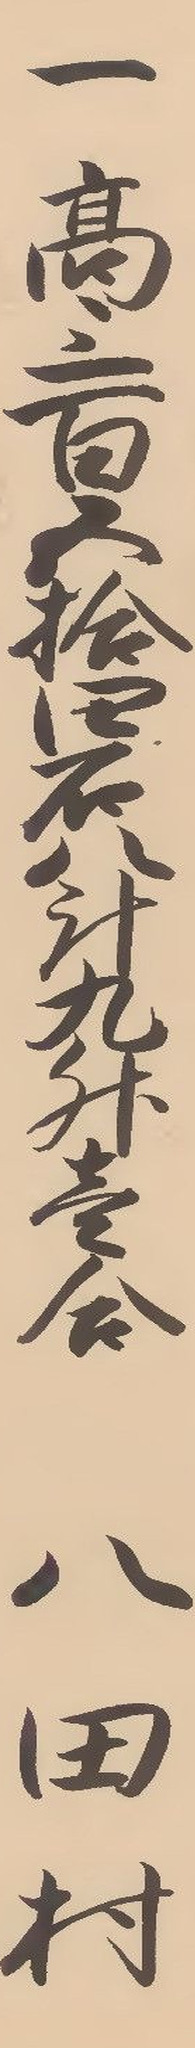一高三百五拾四石八斗九升壱合八田村
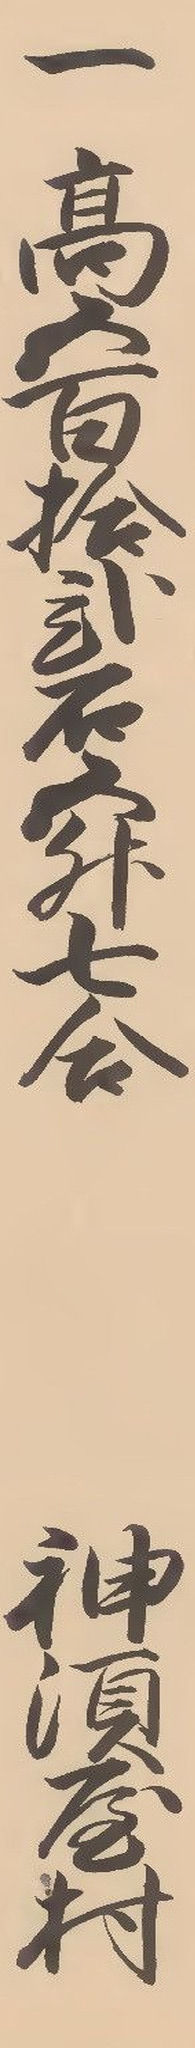一高五百拾弐石五升七合神須屋村
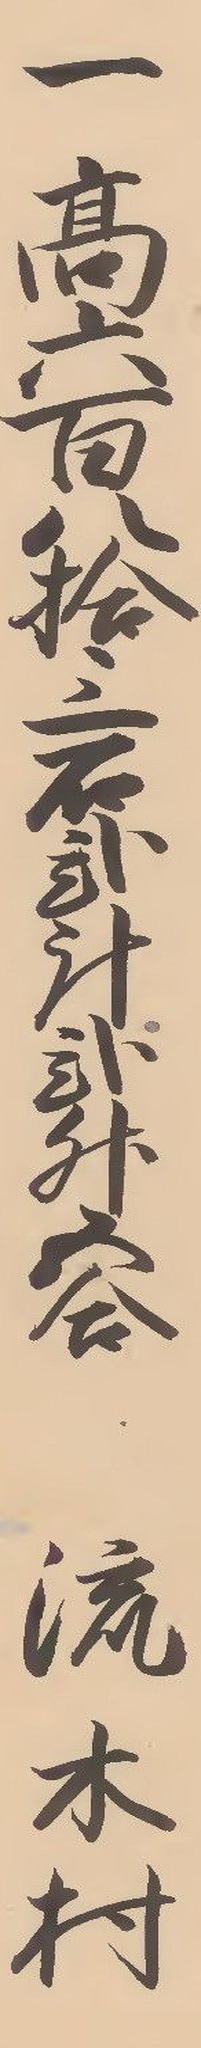一高六百八拾三石弐斗弐升五合流木村

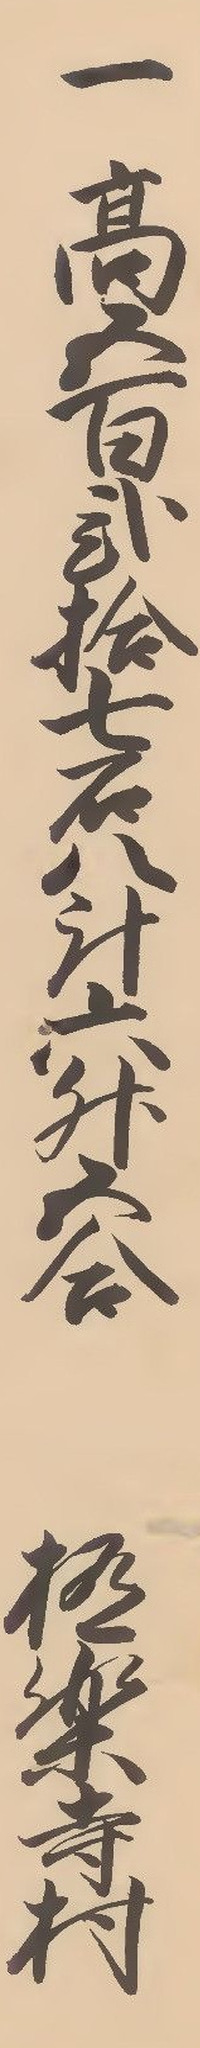一高五百弐拾七石八斗六升五合極楽寺村
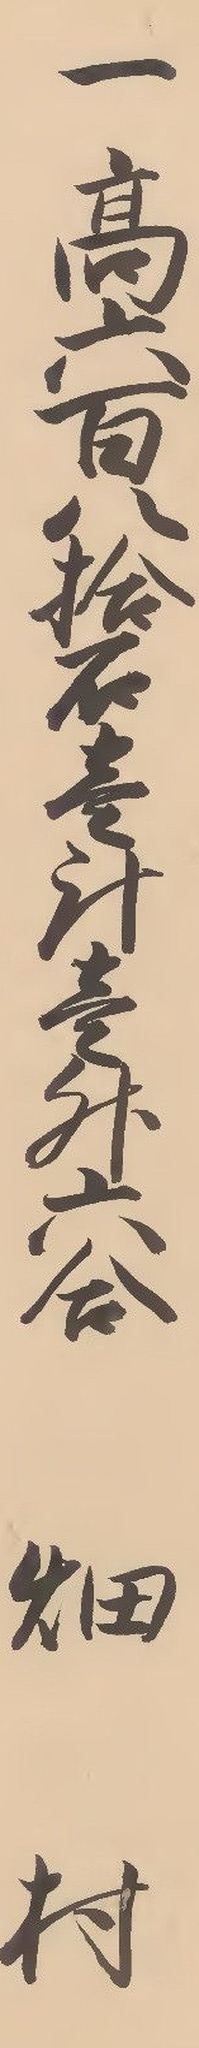一高六百八拾石壱斗壱升六合畑村
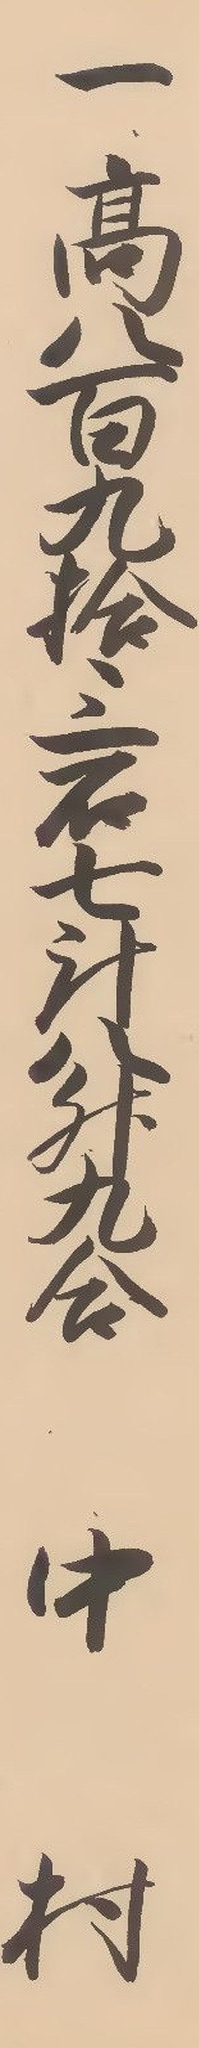一高八百九拾三石七斗八升九合中村
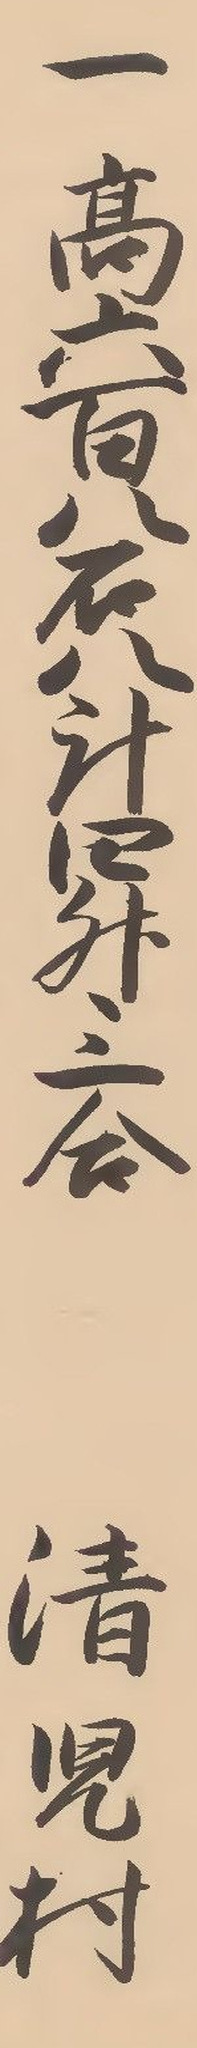一高六百八石八斗四升三合清児村
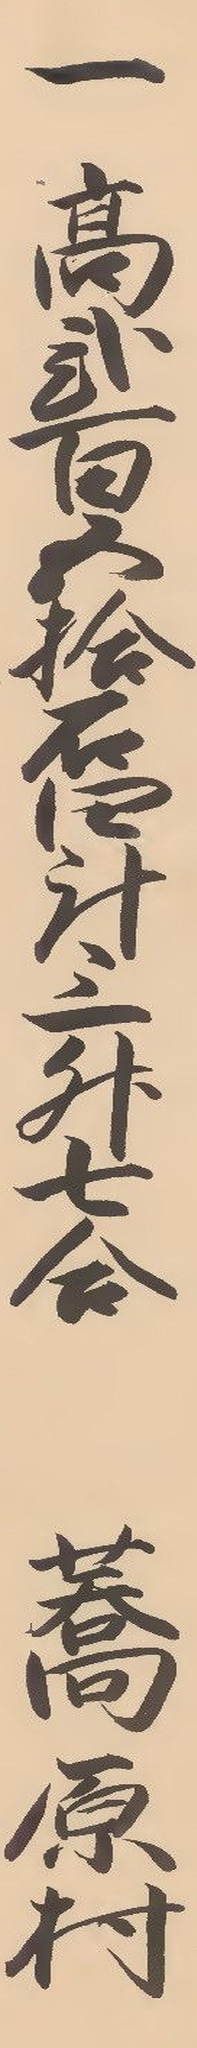一高弐百五拾石四斗三升七合蕎原村
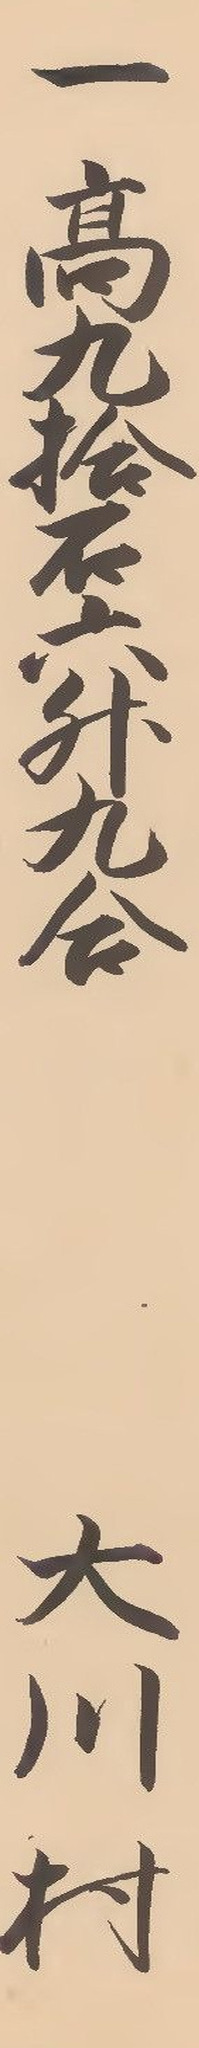一高九拾石六升九合大川村
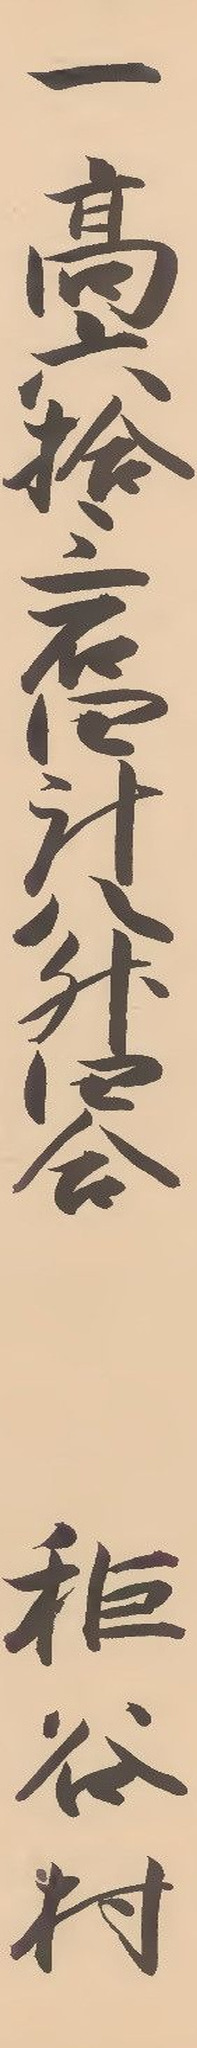一高六拾三石四斗八升四合秬谷村
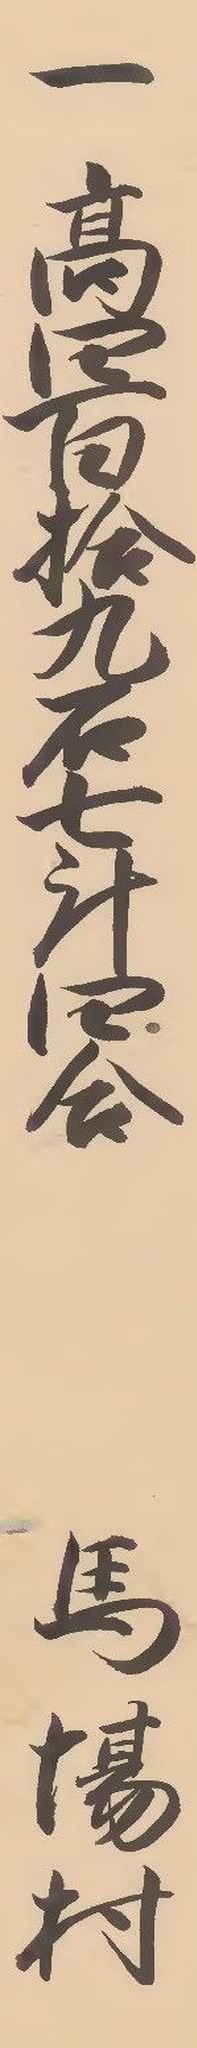一高四百拾九石七斗四合馬場村

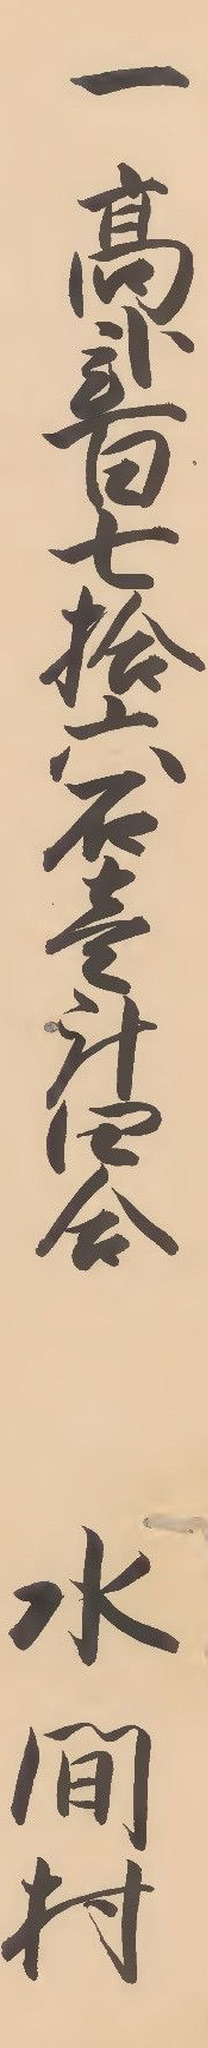一高弐百七拾六石壱斗四合水間村
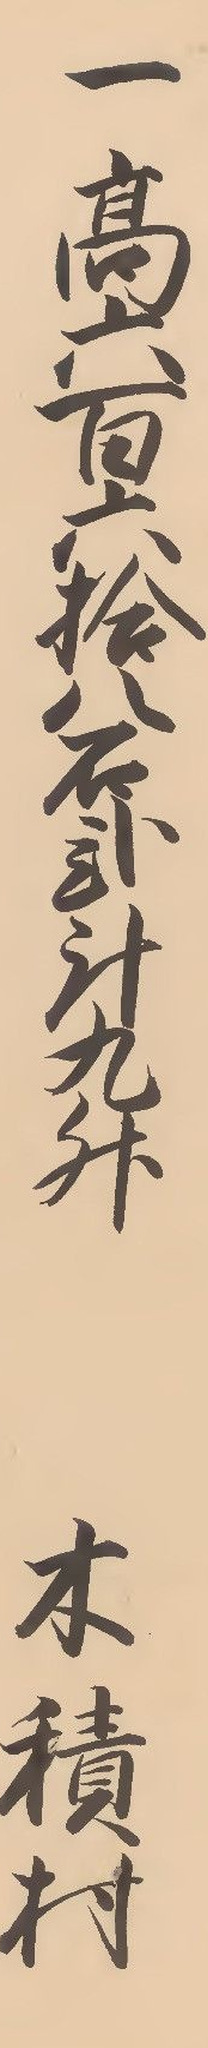一高六百六拾八石弐斗九升木積村
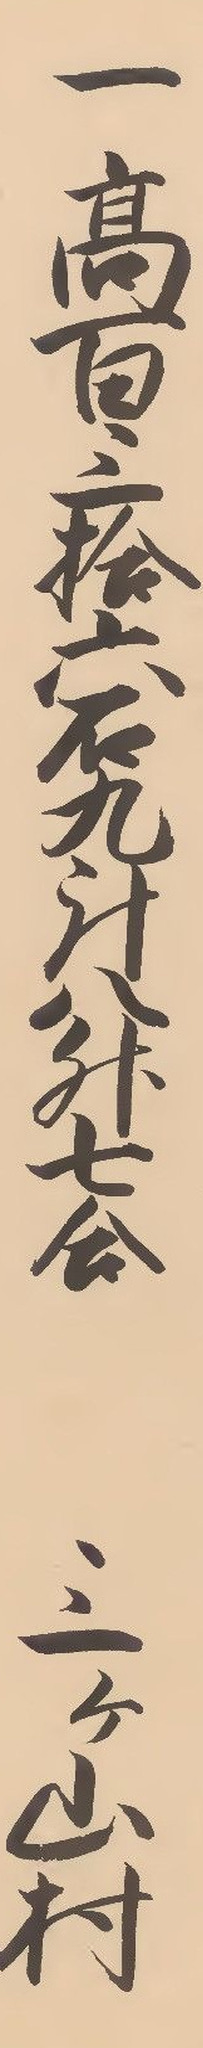一高百三拾六石九斗八升七合三ヶ山村
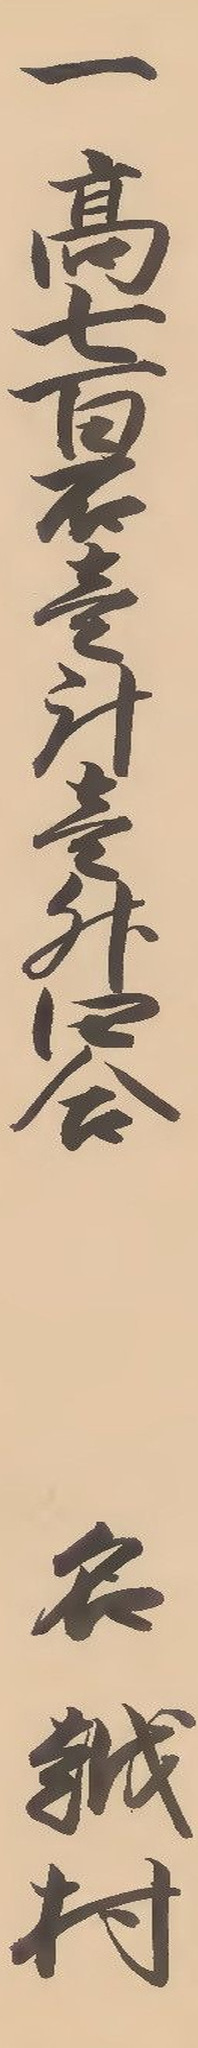一高七百石壱斗壱升四合名越村
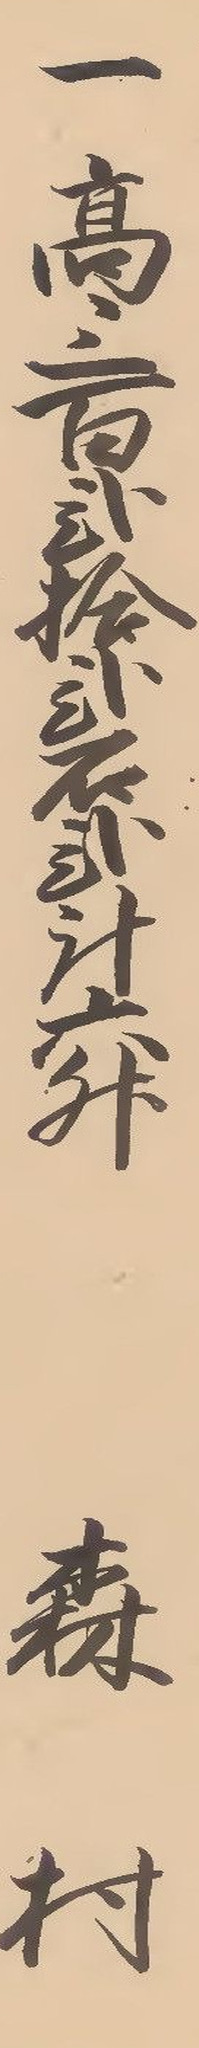一高三百弐拾弐石弐斗六升森村
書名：和泉国郷帳
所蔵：国立公文書館 National Archives of Japan
